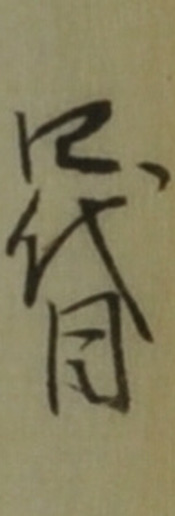四代目
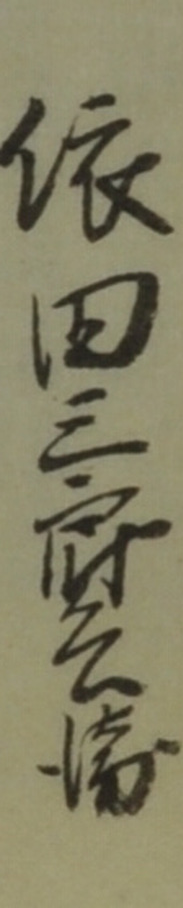依田三郎兵衛
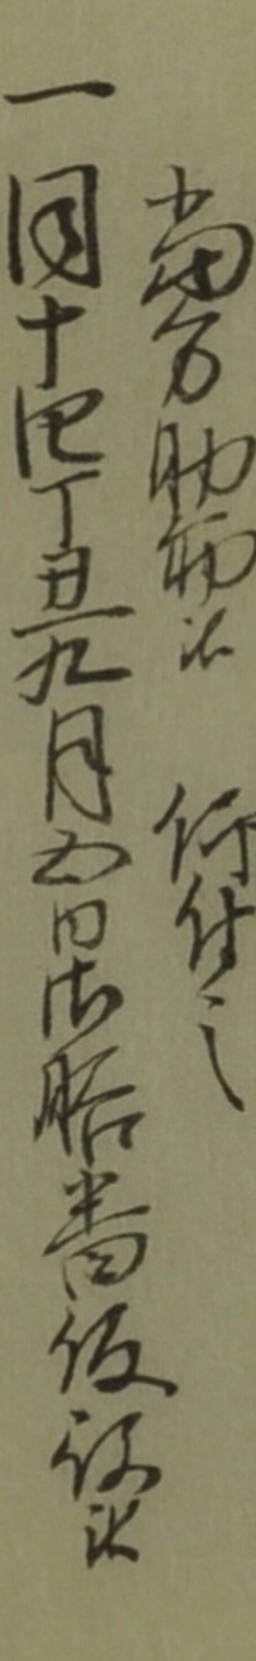一同十四丁丑九月五日御膳番仮役被
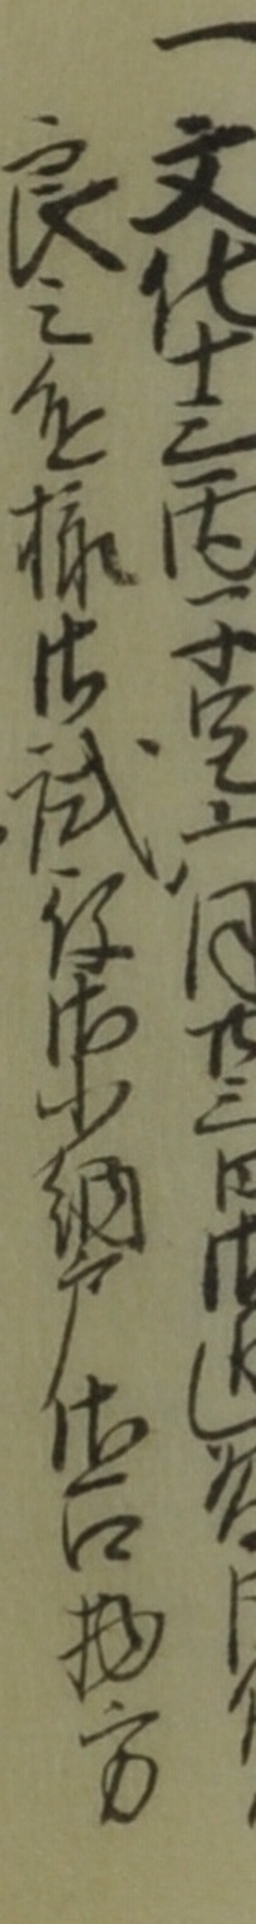良之進様御試役御小納戸御召物方
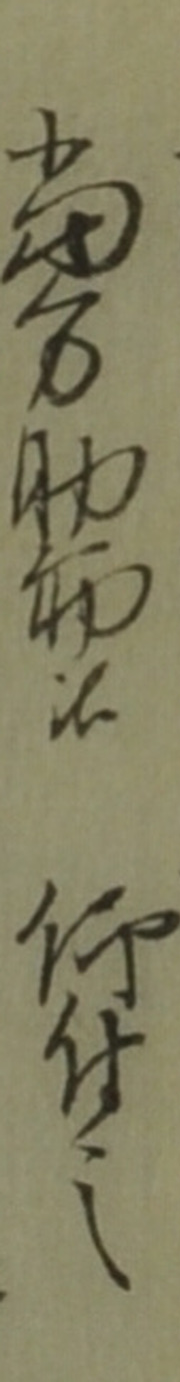当分助勤被仰付之
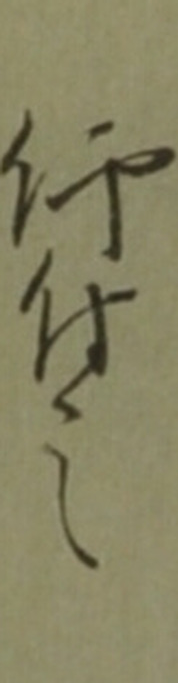仰付之
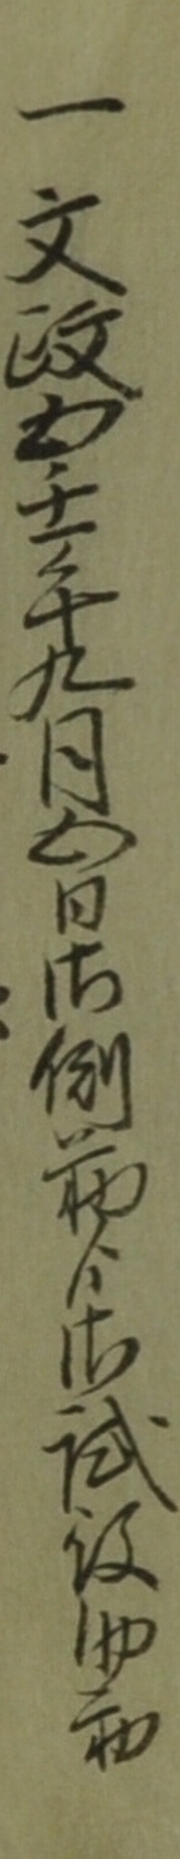一文政五壬午九月五日御側勤ゟ御試役助勤
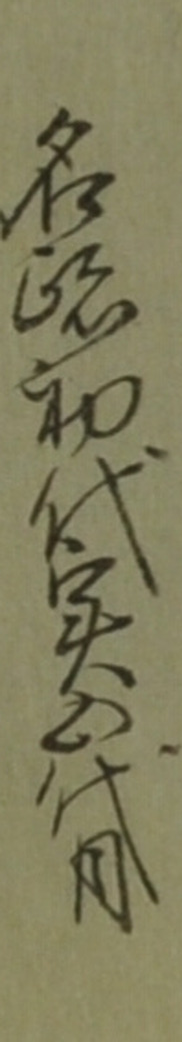再名跡初代実七代目
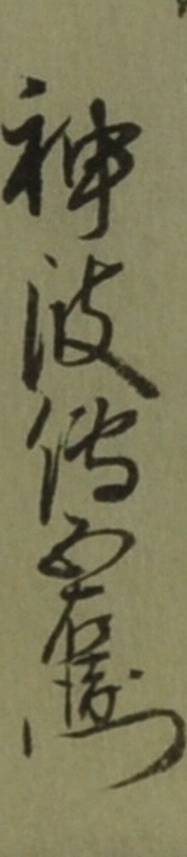神波伝五右衛門
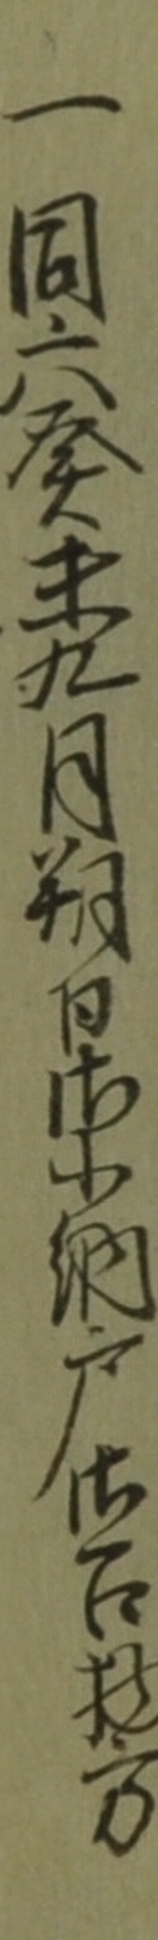一同六癸未九月朔日御小納戸御召物方
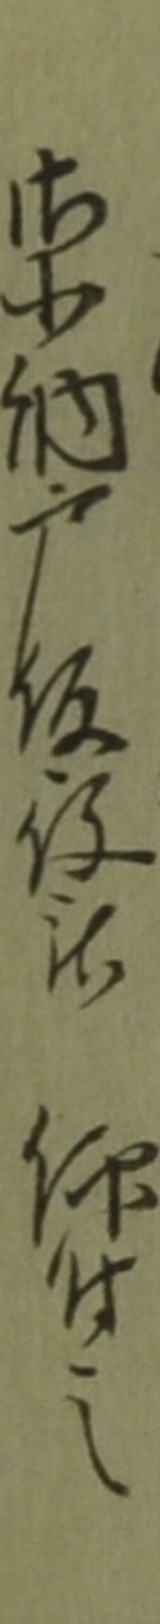御小納戸仮役被仰付之
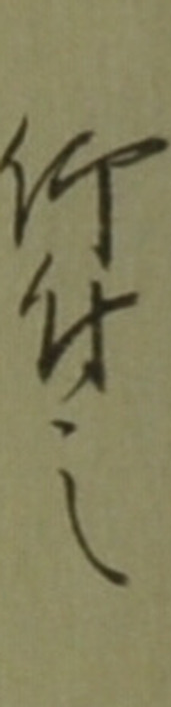仰付之

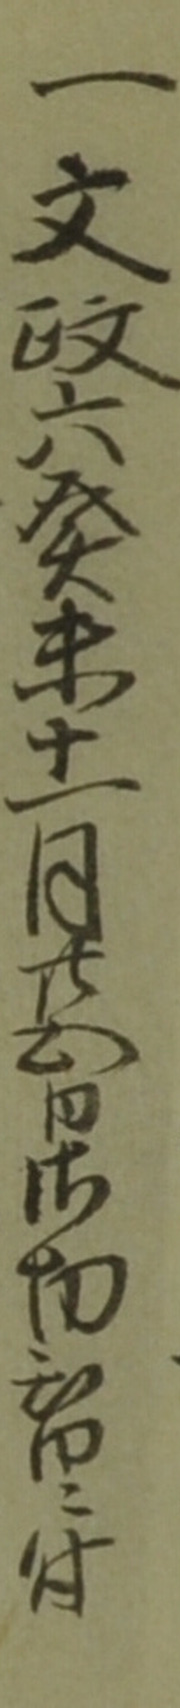一文政六癸未十一月廿五日御切替ニ付
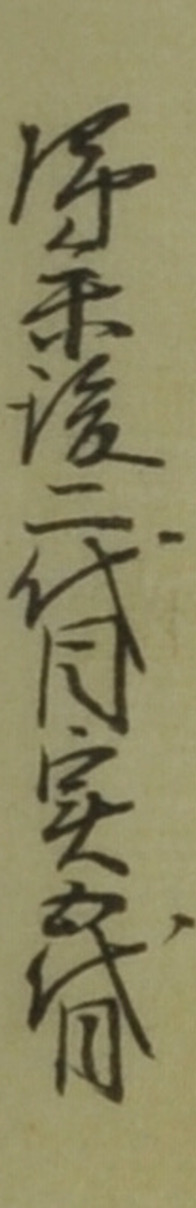帰参後二代目実五代目
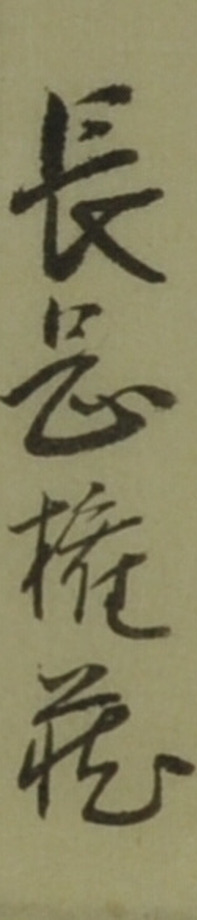長岡権蔵
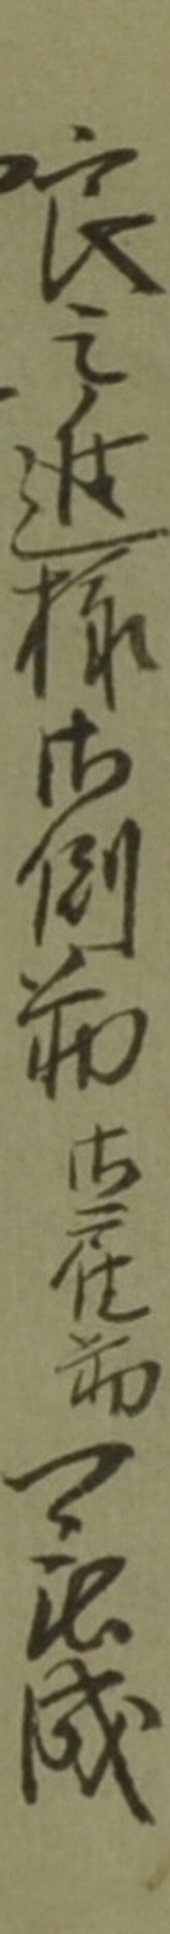良之進様御側勤御雇勤可被成
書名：諸御役代々録（四）
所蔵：伊那市立高遠町図書館・合同会社AMANE
